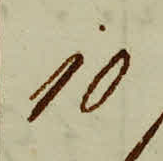10
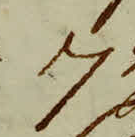7
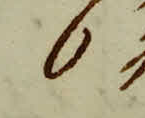6
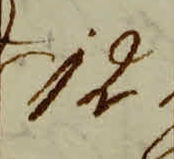12
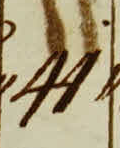44
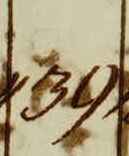39
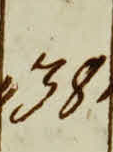38
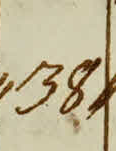38
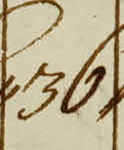36
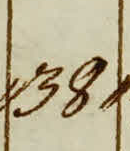38
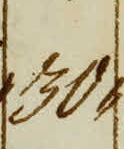30
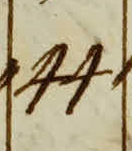44
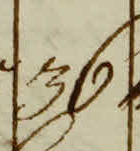36
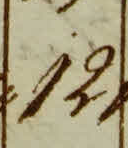12
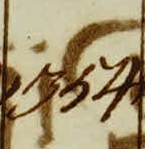354
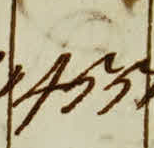455
